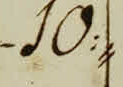10:
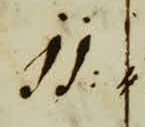11:
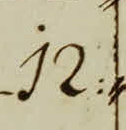12
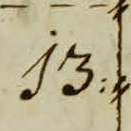13
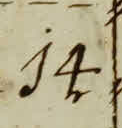14
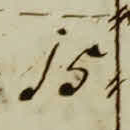15
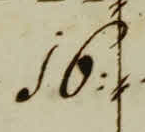16:
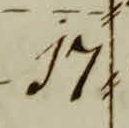17
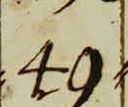49
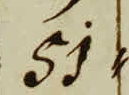51
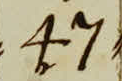47
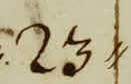23
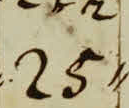25
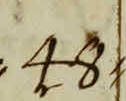48
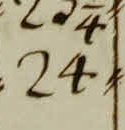24
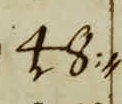48:
